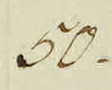50
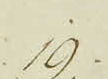19
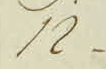12
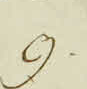9
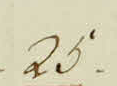25
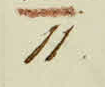11
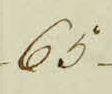65
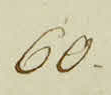60
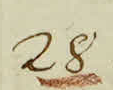28
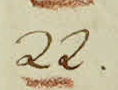22
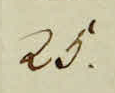25
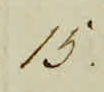15
